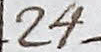24
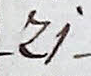21
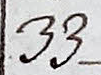33
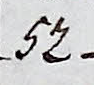52
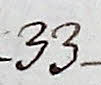33
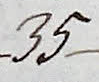35
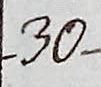30
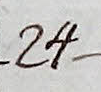24
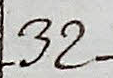32
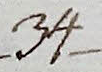34
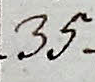35
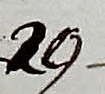29
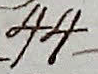44
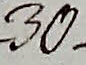30
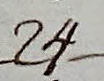24
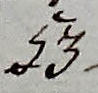53
